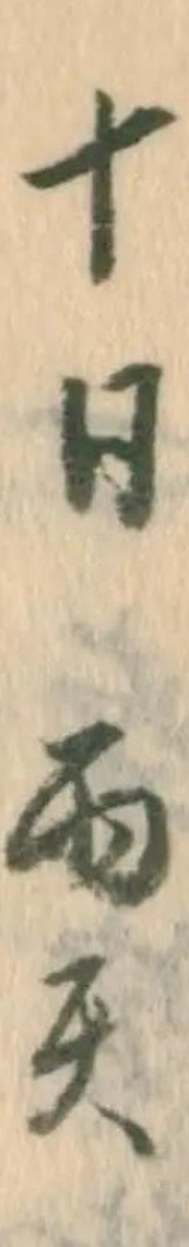十日雨天
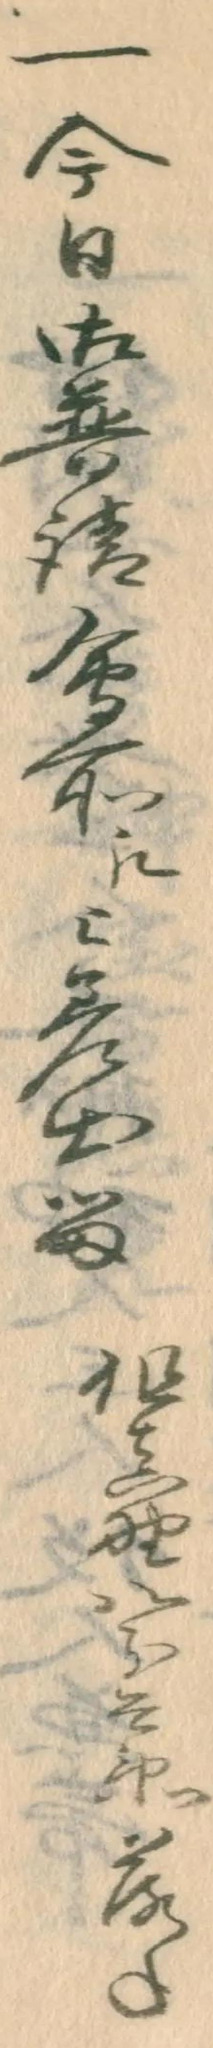一今日御普請会所江被差出留但真野八郎兵衛落手
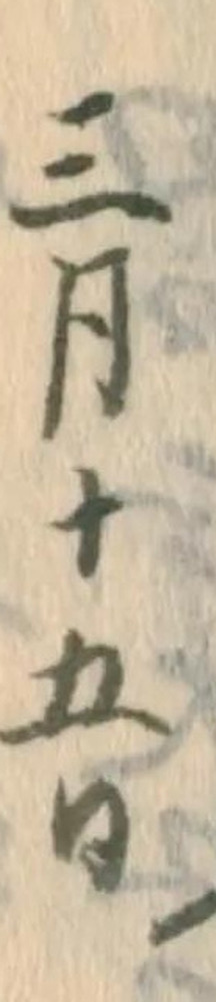三月十五日
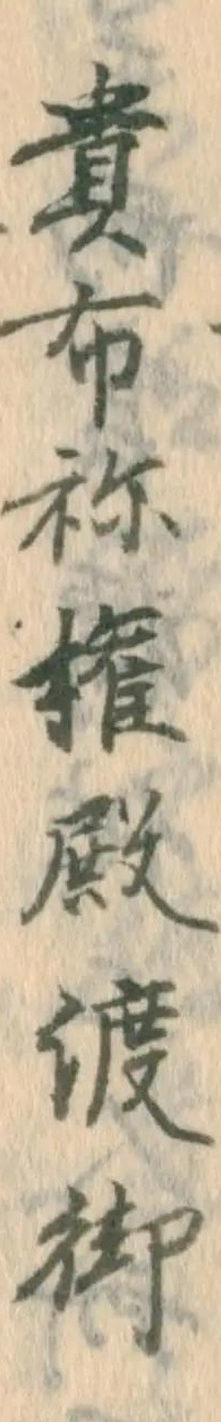貴布祢権殿渡御
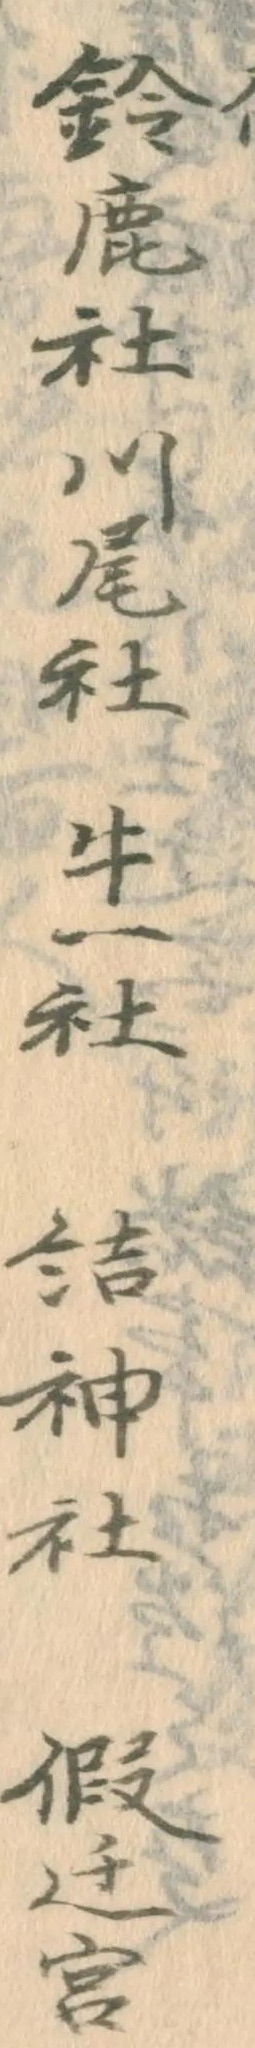鈴鹿社川尾社牛一社結神社仮迁宮
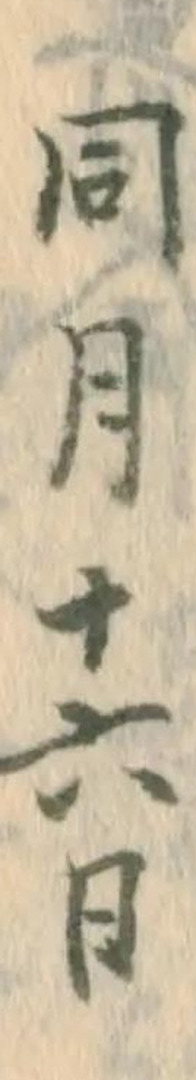同月十六日
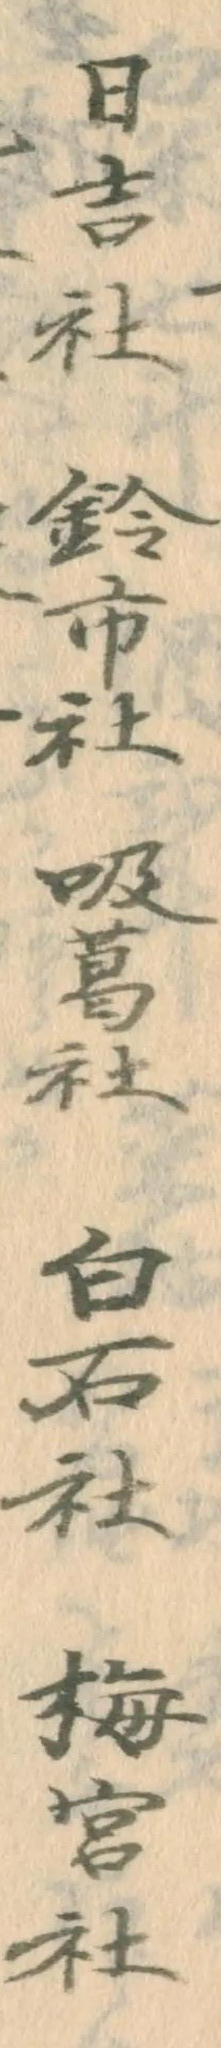日吉社鈴市社吸葛社白石社梅宮社
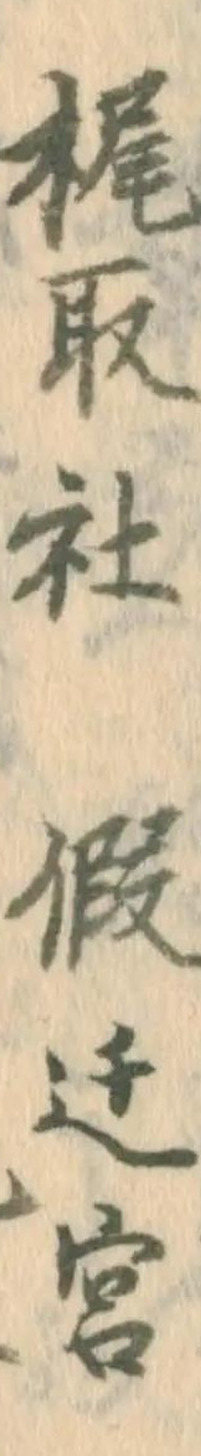梶取社仮迁宮
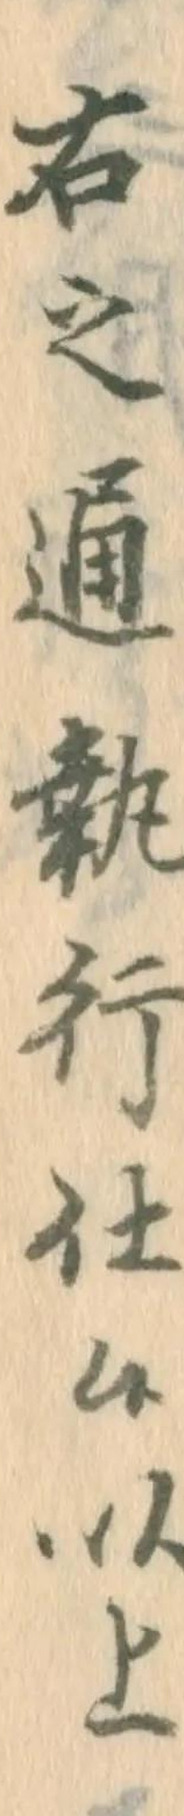右之通執行仕候以上

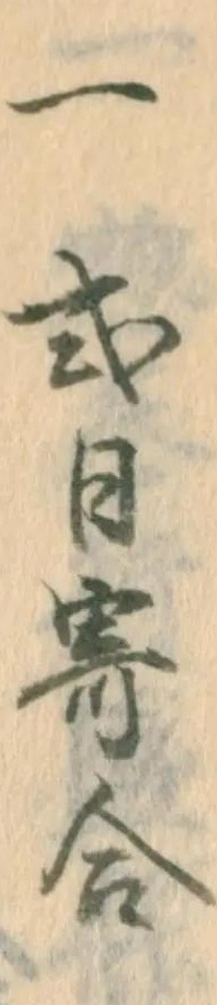一式日寄合
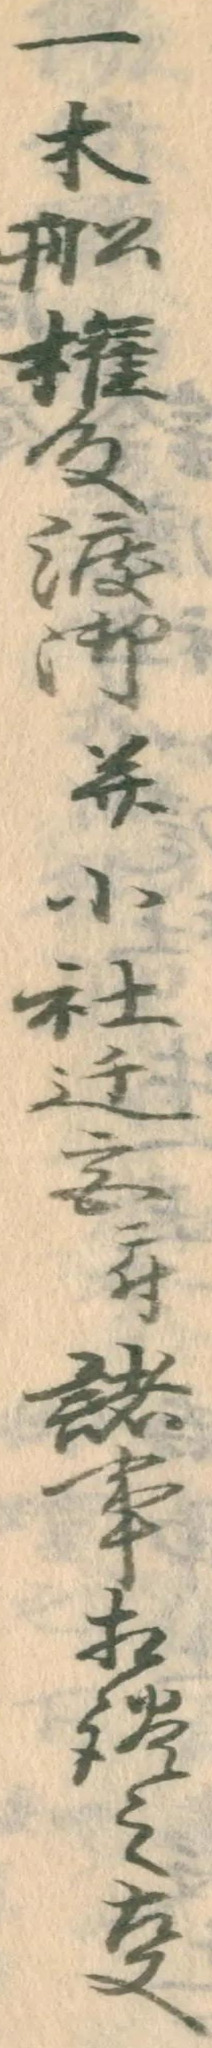一木船権殿渡御并小社迁宮ニ付諸事相談之事
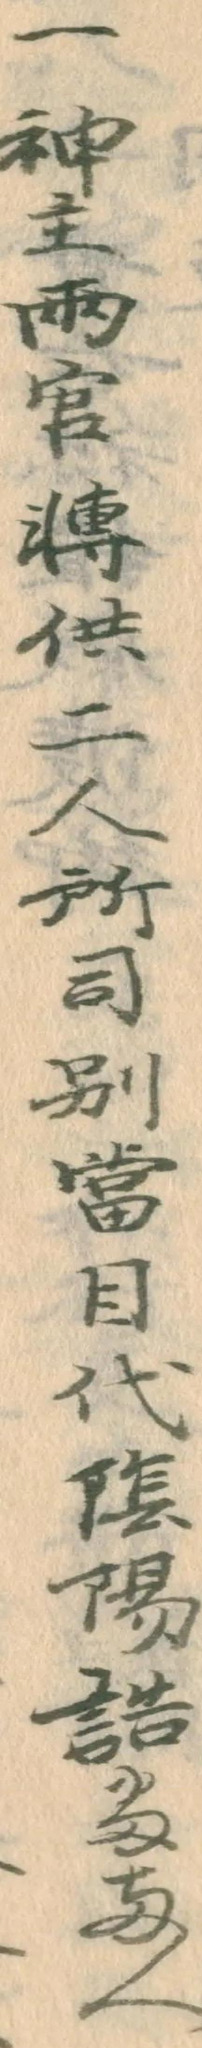一神主両官転供二人所司別当目代陰陽詰番両人
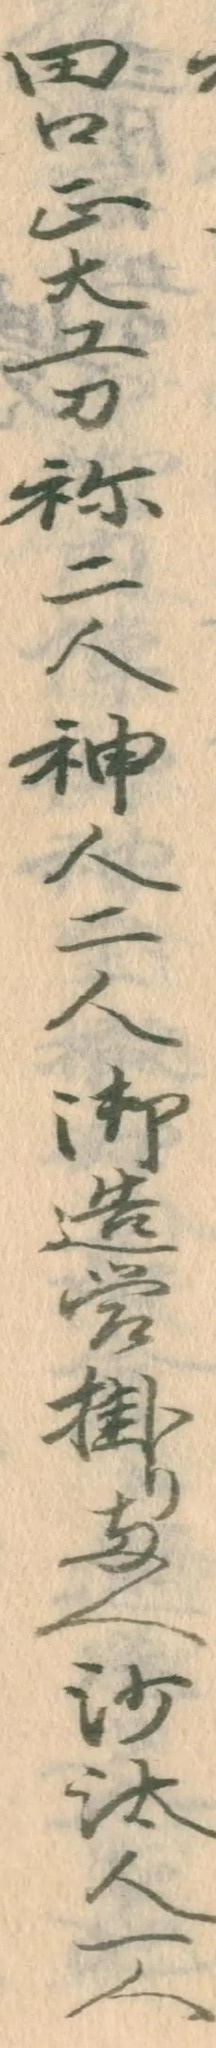田口正大工刀祢二人神人二人御造営掛り両人沙汰人一人
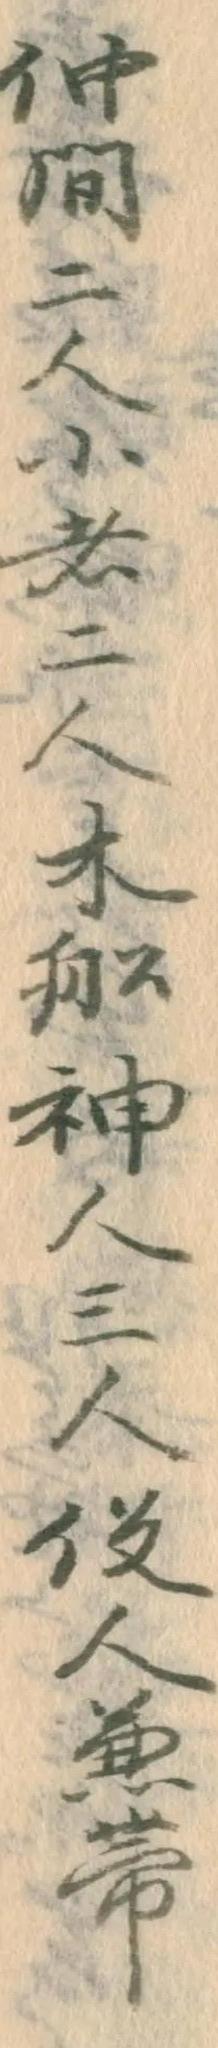仲間二人小者二人木船神人三人役人兼帯
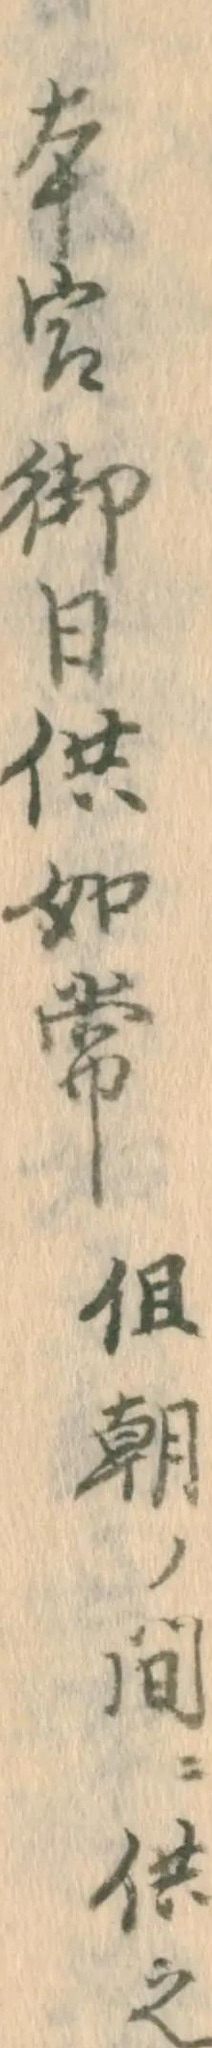一本宮御日供如常但朝ノ間ニ供之
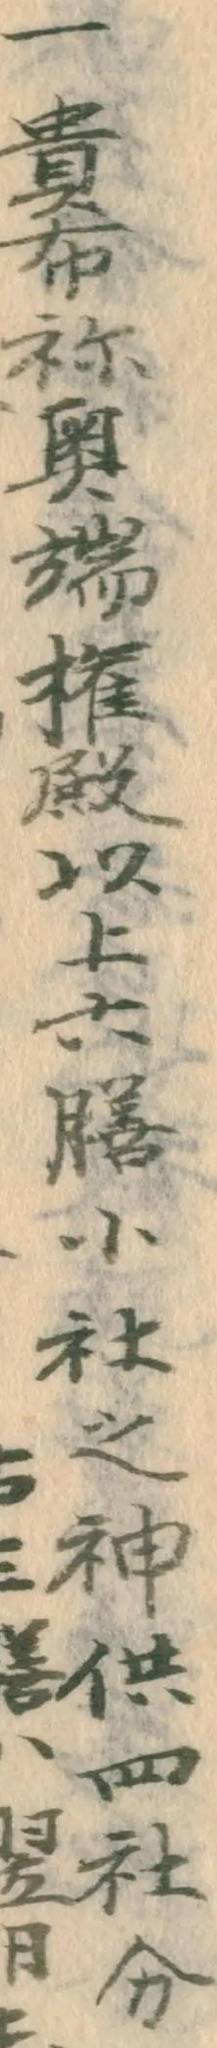一貴布祢奥端権殿以上六膳小社之神供四社分
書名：賀茂社記録. 第17冊
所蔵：国立国会図書館 National Diet Library, JAPAN
